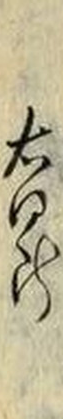右同断
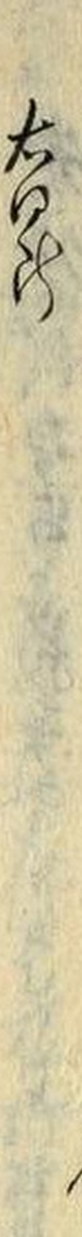右同断
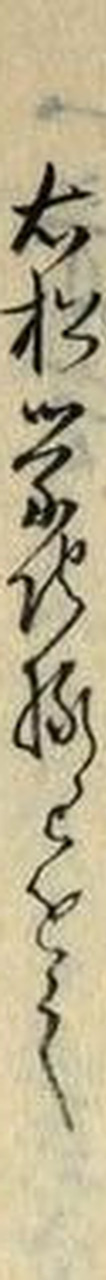右松栄院様被進之
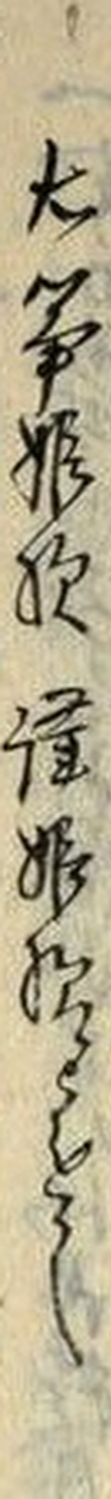右箏姫様謹姫様へ被進之
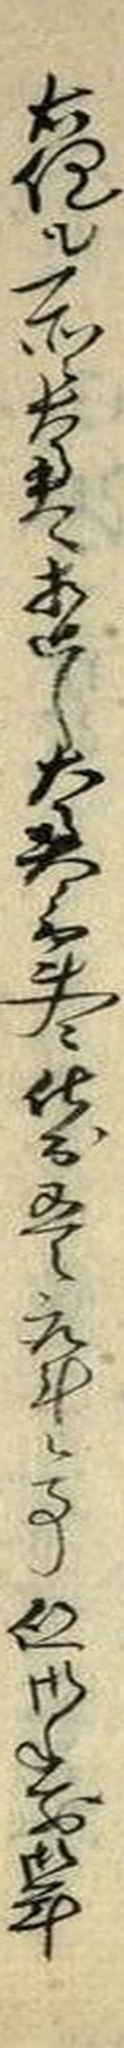右何も一所ニ大奥へ相廻し大奥ニ而夫々仕分有之取斗候事但御手前御年
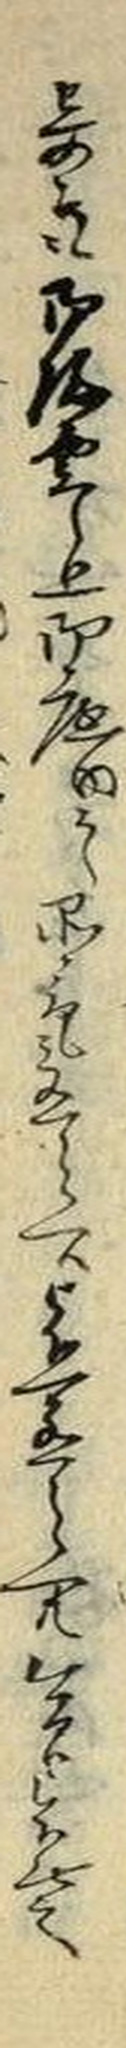寄江も御帰殿之上御庭内之品ニ而も有之候へハ被下可有之候へ共今日ハ被下無之
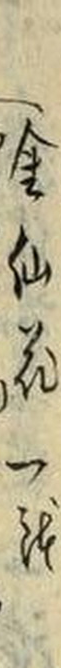金仙花一鉢
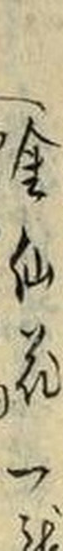金仙花一鉢
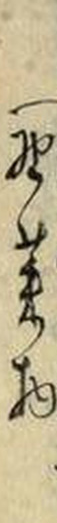野菜物

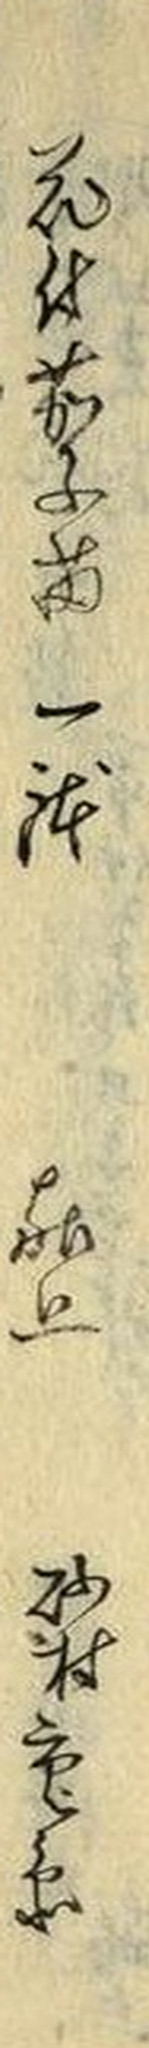花付茄子苗一鉢献上砂村市郎兵衛
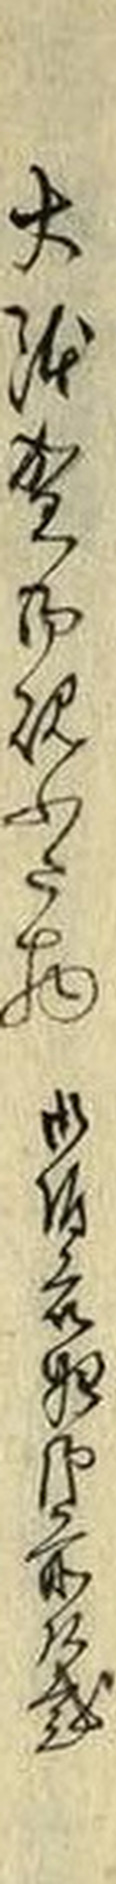大鉢盛御硯ふた物御附衆始御前頂戴
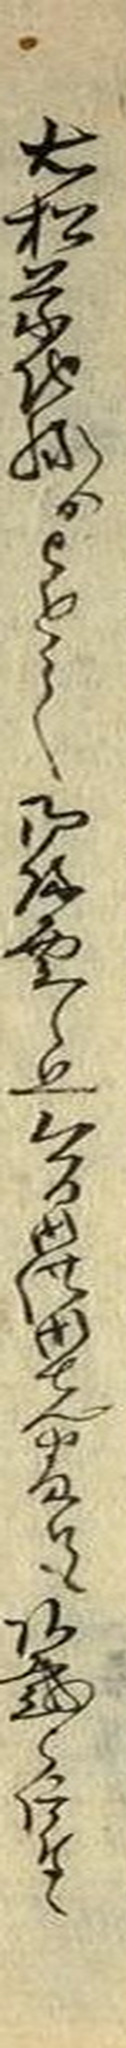右松栄院様ゟ被進之御帰殿之上今日御供御先番江も頂戴被仰付候
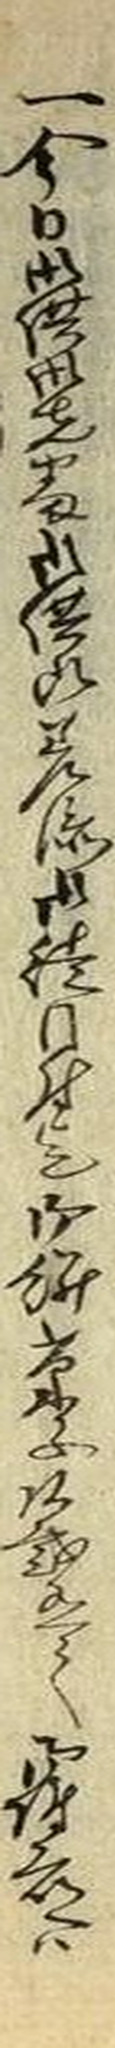一今日御供御先番御供頭差添御徒目付迄御餅菓子頂戴有之御附衆へハ
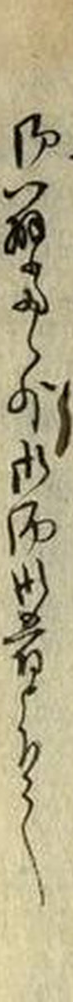御弁当之外御酒御肴被下之
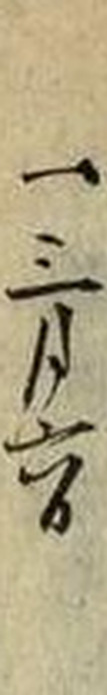一三月六日
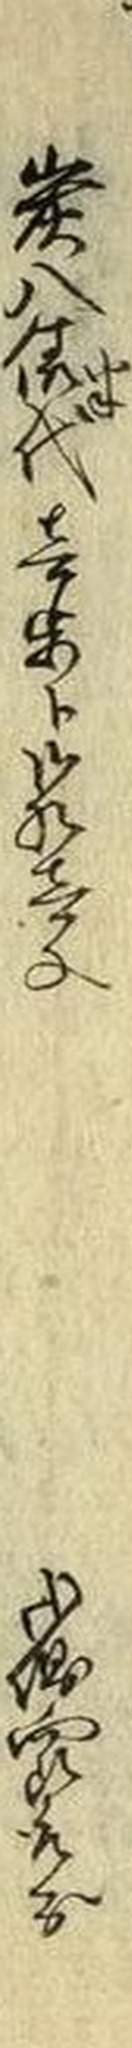炭八俵半代壱歩ト弐拾壱文御側向衆取分
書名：少傅日録抄（斉善付側向頭取日記、江戸并道中、初入在国、逝去後…
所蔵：福井県文書館 Fukui Prefectural Archives
